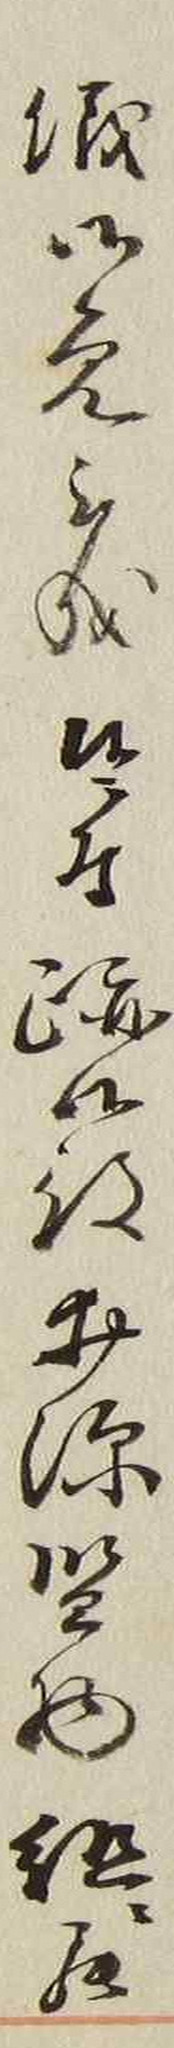儀御免被成候ニ付跡御役井深監物組ニ罷
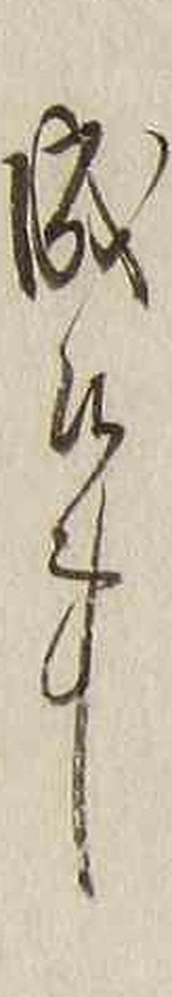成候事
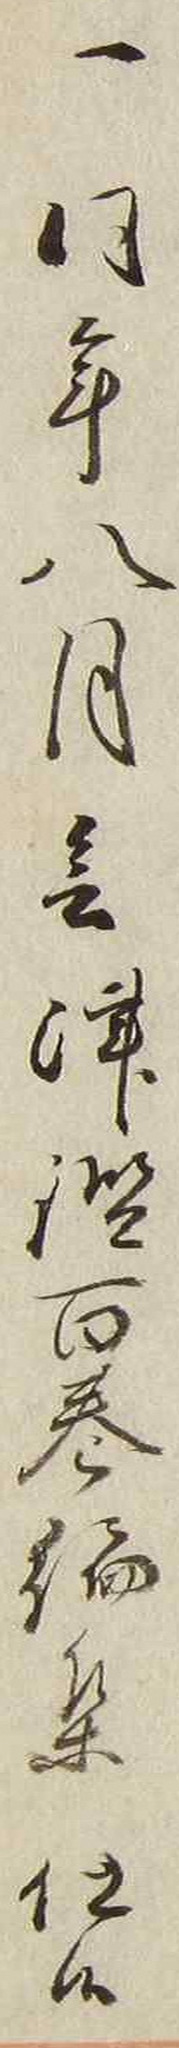一同年八月会津鑑百巻編集仕候

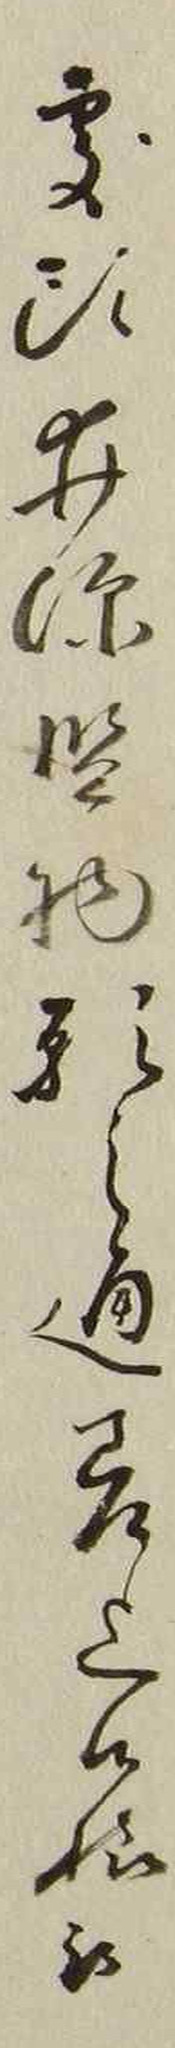処頭井深監物願之通差上候様被
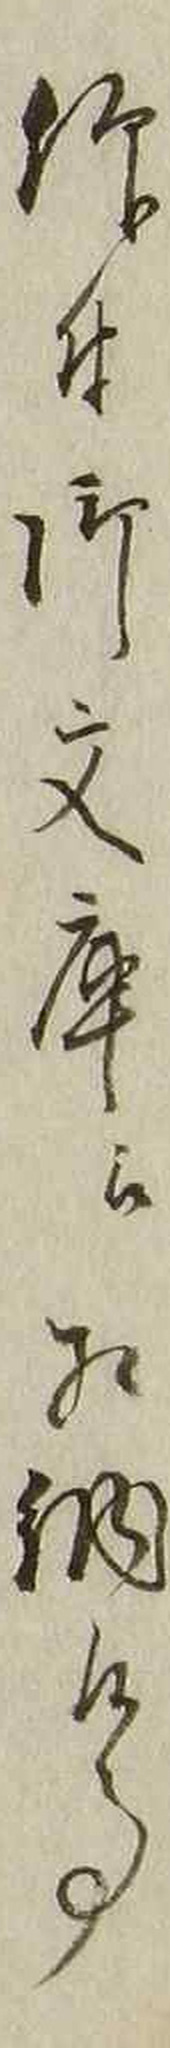仰付御文庫江相納候事
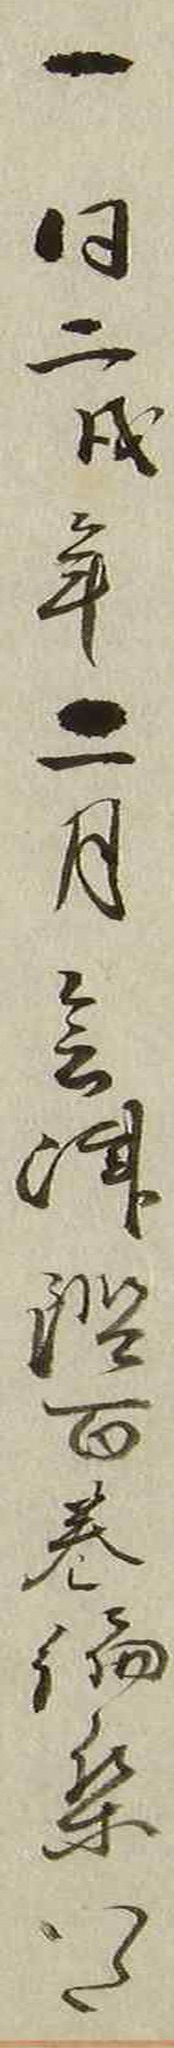一同二戌年二月会津鑑百巻編集いた
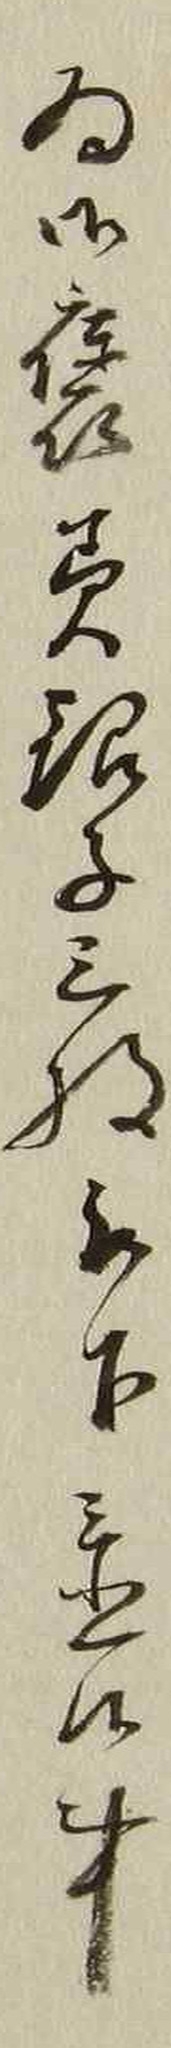為御褒美銀子三枚被下置候事
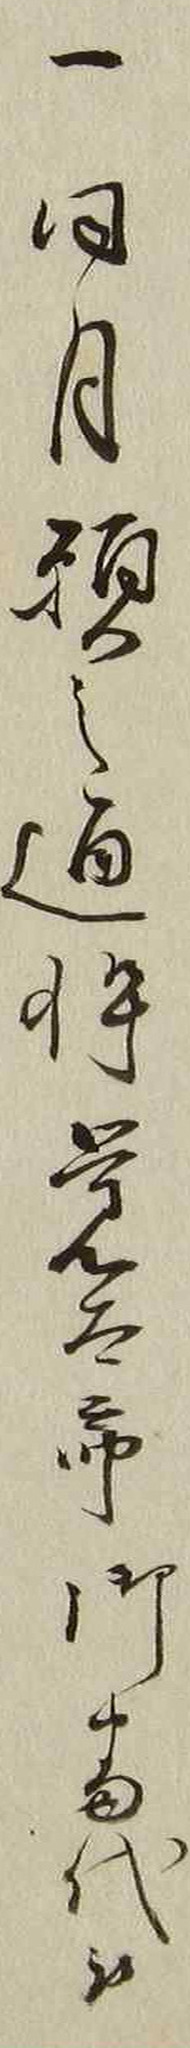一同月願之通忰覚太郎御番代被
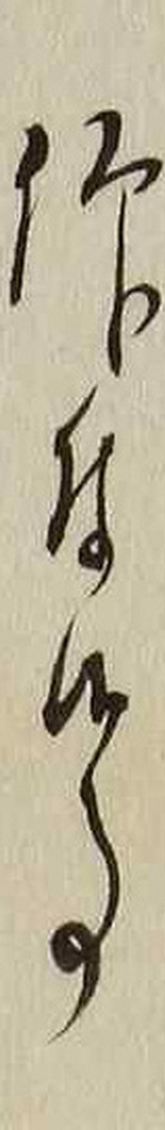仰付候事
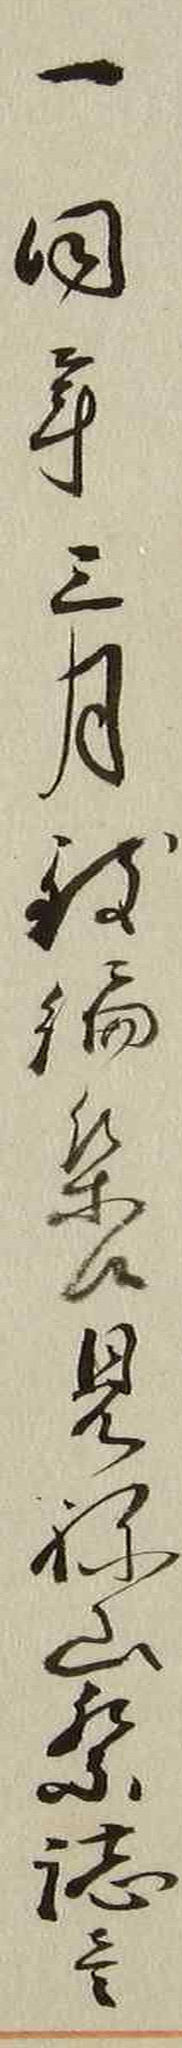一同年三月致編集候見祢山祭誌壱
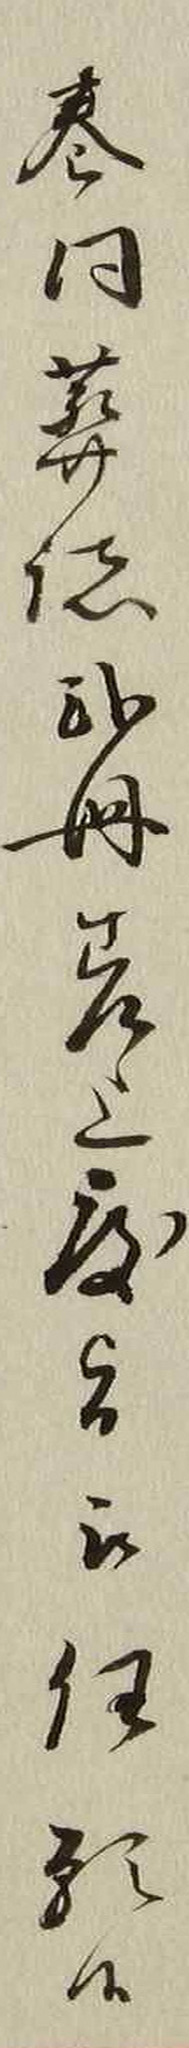巻同葬誌弐冊差上度旨被任願候
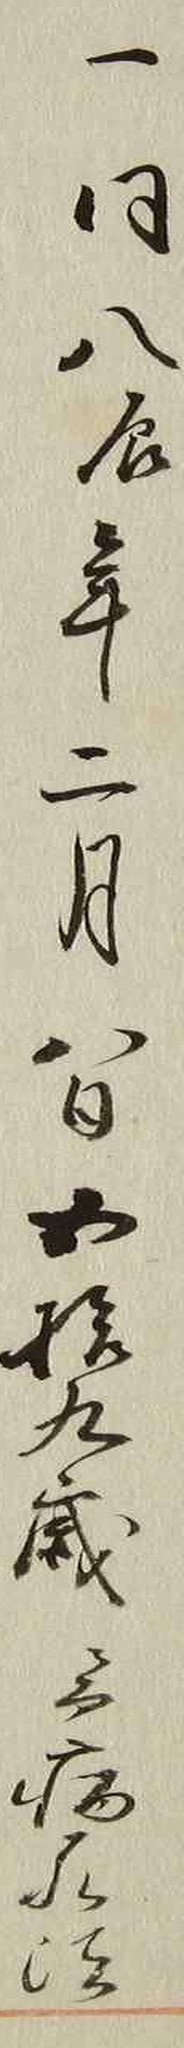一同八辰年二月八日五拾九歳ニ而病死法
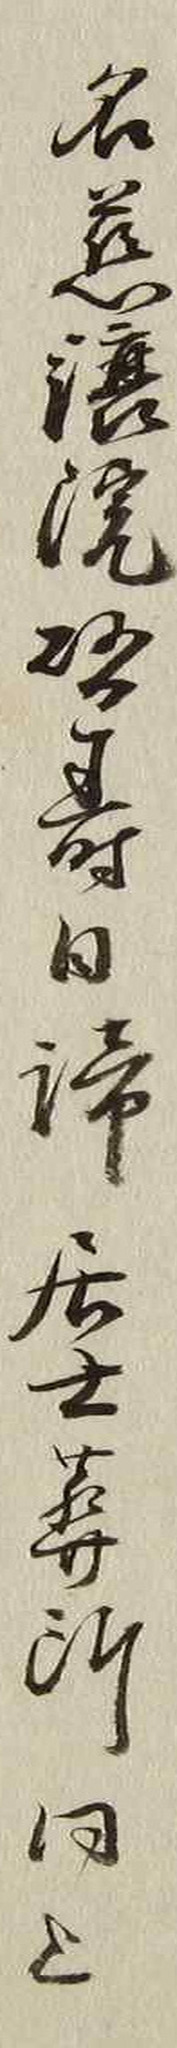名慈譲院啓寿日諦居士葬所同上
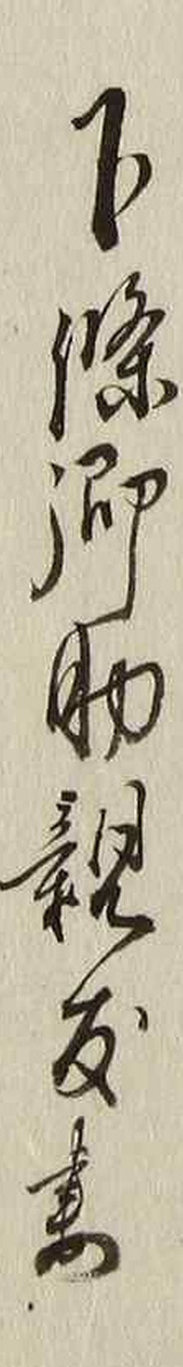女下條郷助親友妻
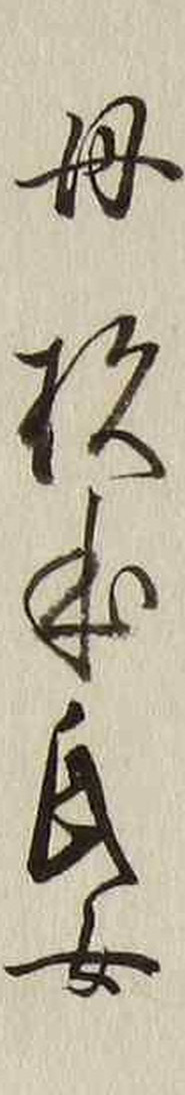母杉本氏女
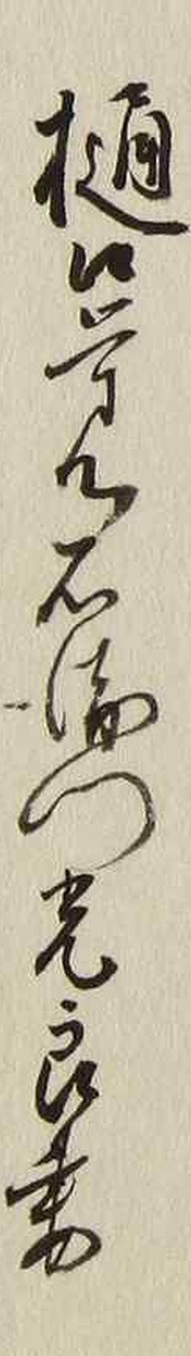女樋口覚右衛門光良裏
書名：諸士系譜　巻之141　た之部17
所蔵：会津若松市立会津図書館
